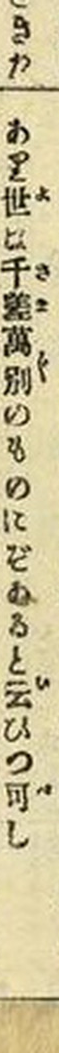あり世は千差萬別のものにぞゐると云ひつ可し
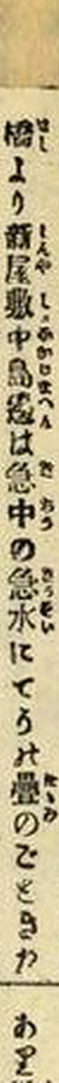橋より新屋敷中島邊は急中の急水にてかの疂のごときた
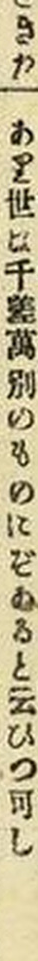あり世は千差萬別のものにぞゐると云ひつ可し
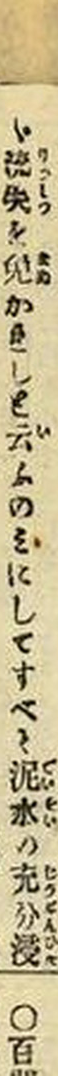ゞ流失を免かれしと云ふのみにしてすべて泥水の充分浸
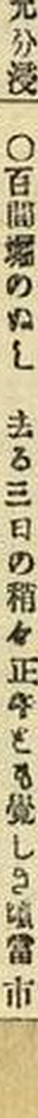○百間堀のぬし去る三日の稍々正午とも覺しき頃當市
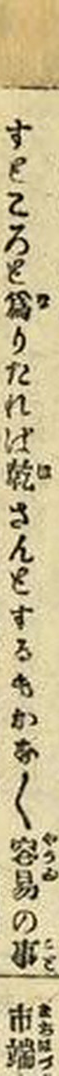すところと爲りたれば乾さんとするもかな〳〵容易の事
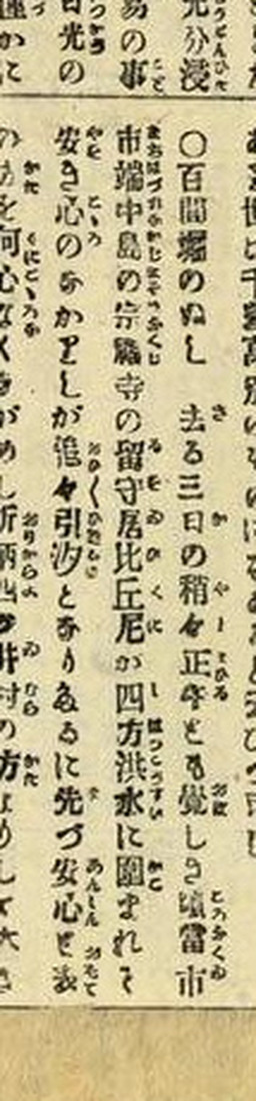市端中島の宗福寺の留守居比丘尼が四方洪水に圍まれて
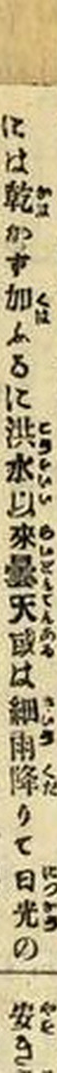には乾かず加ふるに洪水以來曇天或は細雨降りて日光の
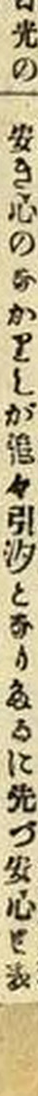安き心のなかりしが追々引汐となりたるに先づ安心と表
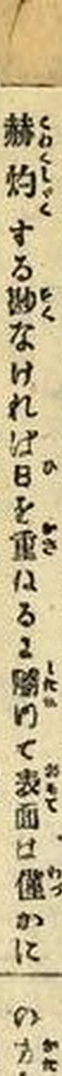赫灼する尠なければ日を重ねるに隨つて表面は僅かに
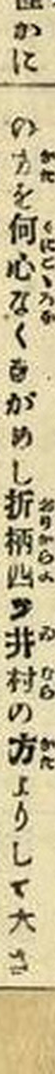の方を何心なくながめし折柄四ツ井村の方よりして大さ
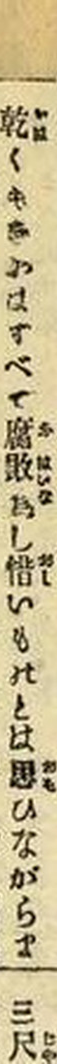乾くもなかはすべて腐敗爲し惜いものとは思ひながらま
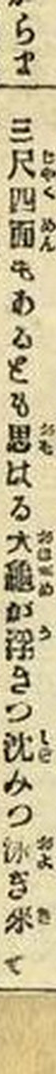三尺四面もあるとも思はる大龜が浮きつ沈みつ泳ぎ來て
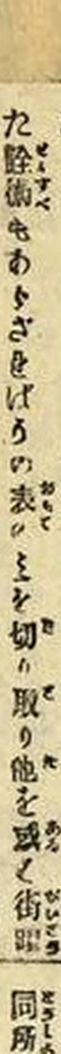た詮術もあらざればかの表のみを切り取り他を或は街躍
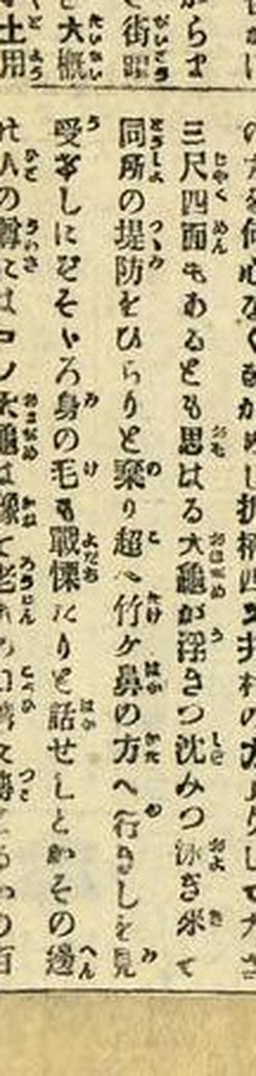同所の堤防をひらりと乘り越へ竹ケ鼻の方へ行きしを見
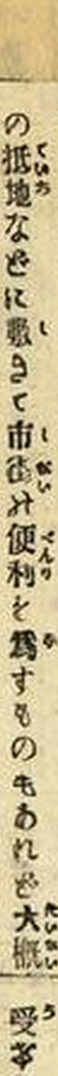の低地などに敷きて市街の便利を爲すものもあれど大概
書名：温古集 五巻
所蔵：福井県文書館 Fukui Prefectural Archives
